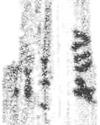與
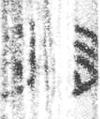宜
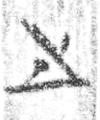之
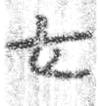也
